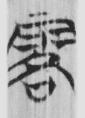{雨各}
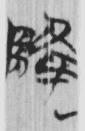降
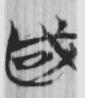或
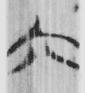六
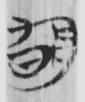旬
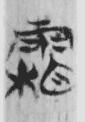霜
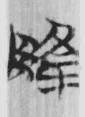降
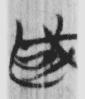或
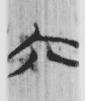六
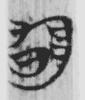旬
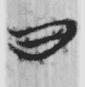日
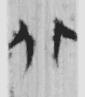北
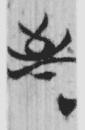至
